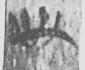卌
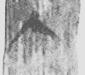六
